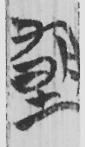{土旬}
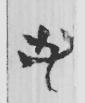屯
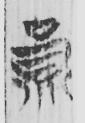員
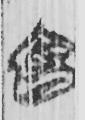{囗馬}
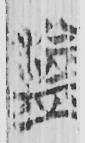{溢皿}
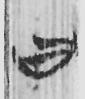曰
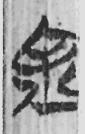余
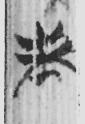未
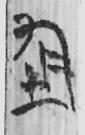均
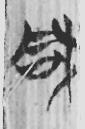凡
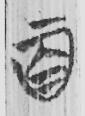百
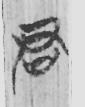君
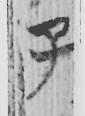子
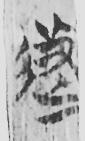﨤
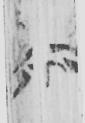尔
